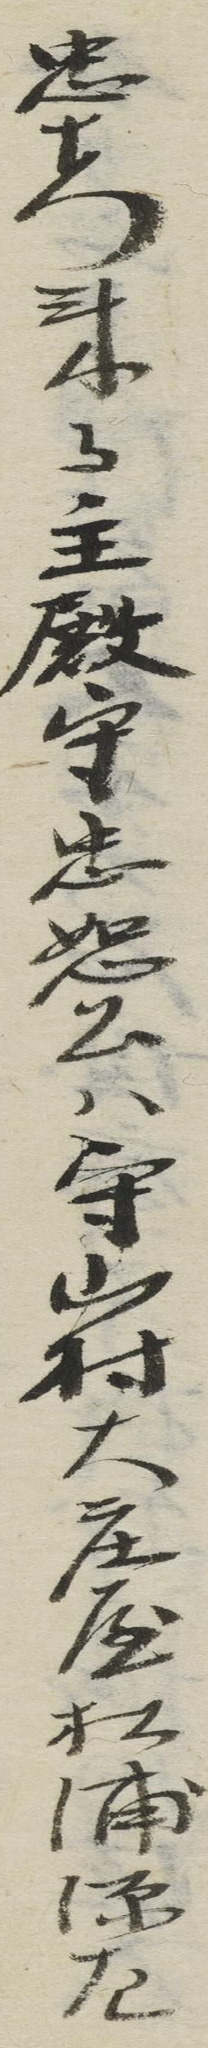忠左衛門来る主殿守忠怒公は守山村大庄屋松浦源左
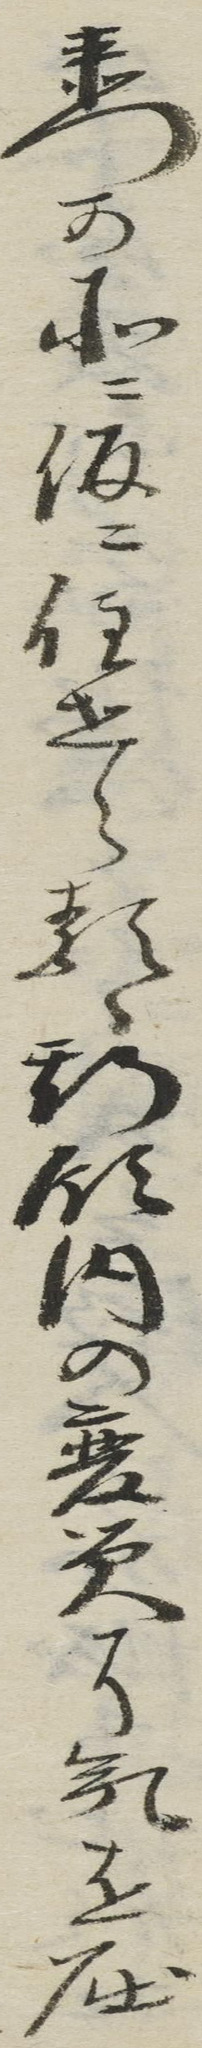衛門か所に仮に住せらるゝ斯領内の変災に気を屈
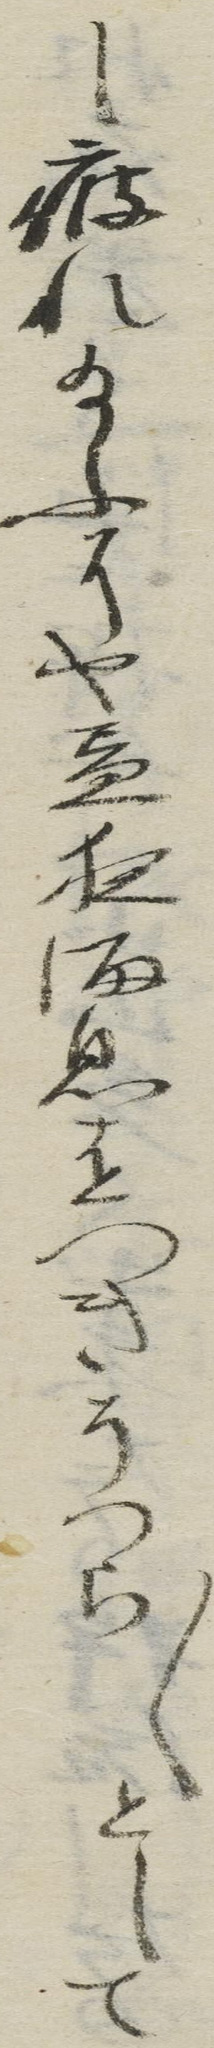し疲れ給ふにや昼夜溜息をつきうつら〳〵として
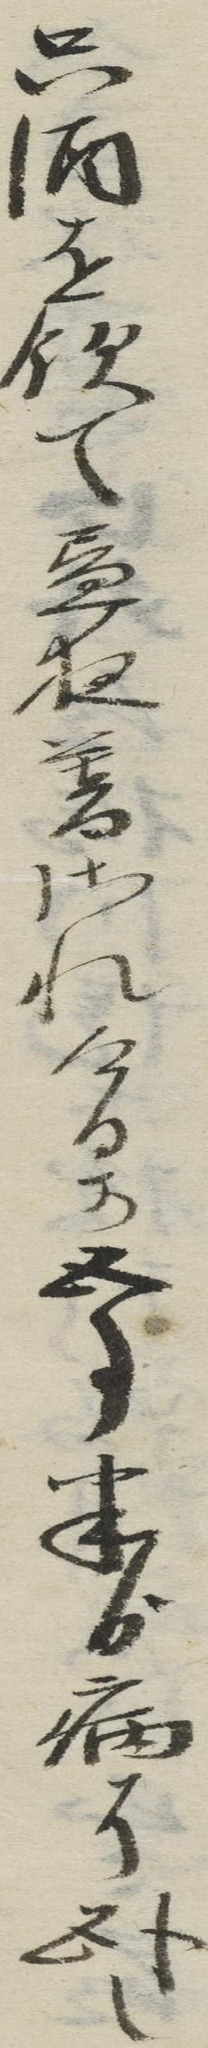只酒を飲て昼夜暮されけるか五月半ゟ病に臥し
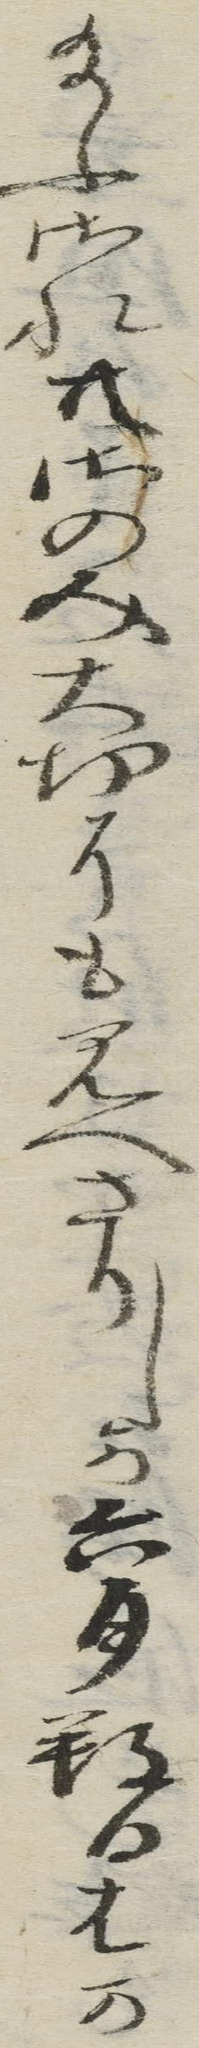給ふされ共さのみ大切にも見へさりしか六月朔日はか
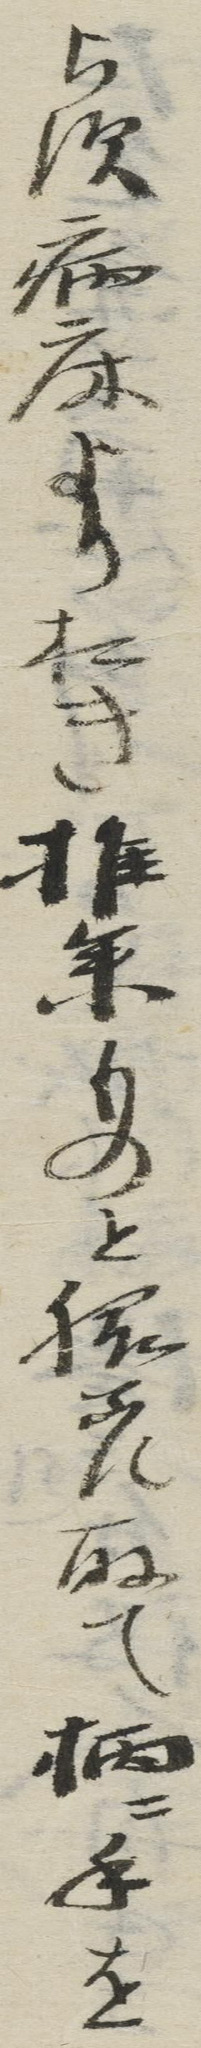らす病床よりおき推参ものと脇差取て柄に手を
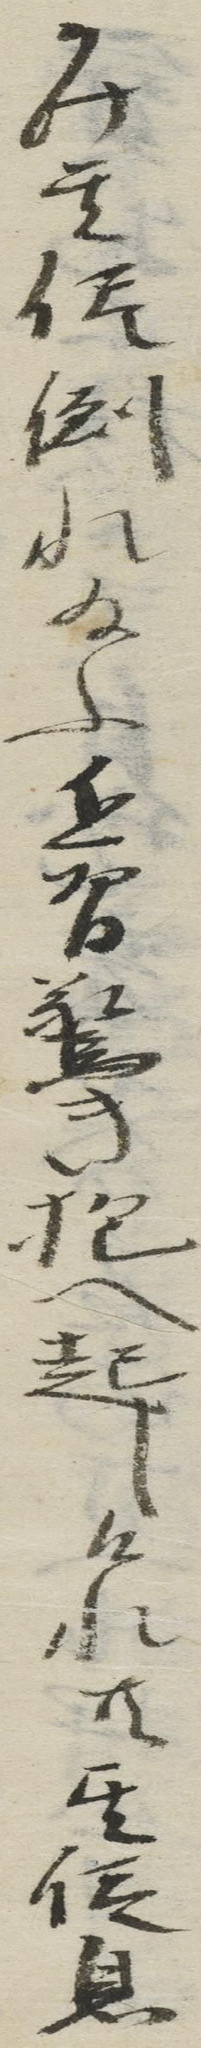かけ其儘倒れ給ふ近習驚き抱へ起しけれ共其儘息
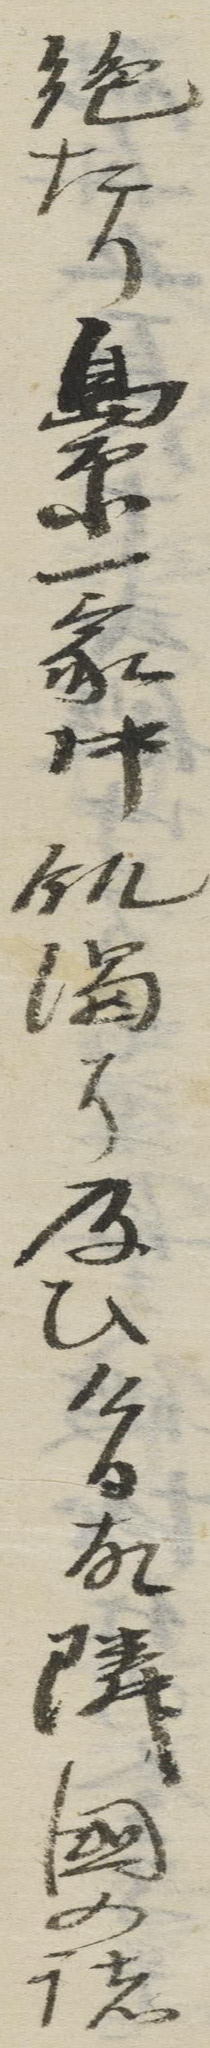絶たり島原一家中飢渇に及ひける故隣国の諸
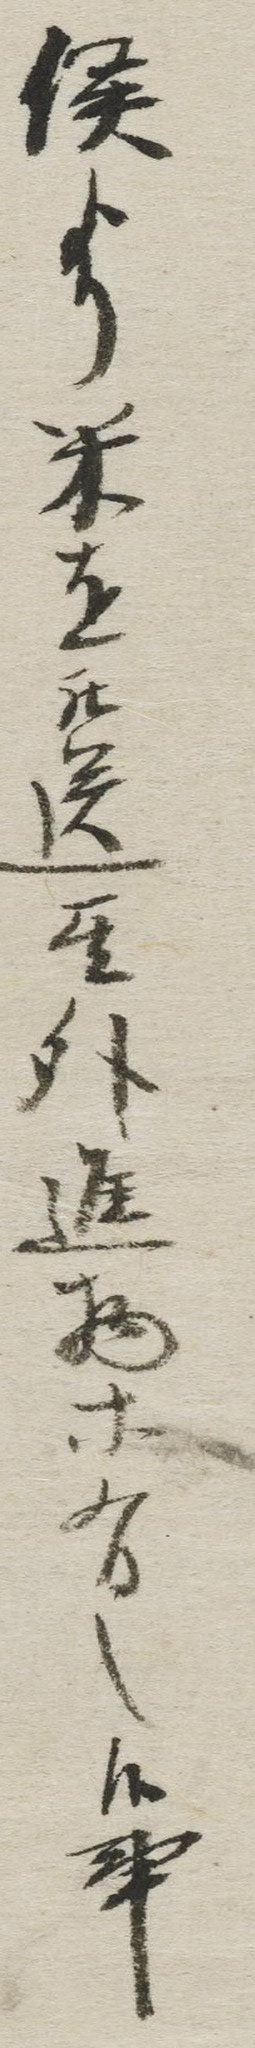侯より米を被送其外進物等有之候事
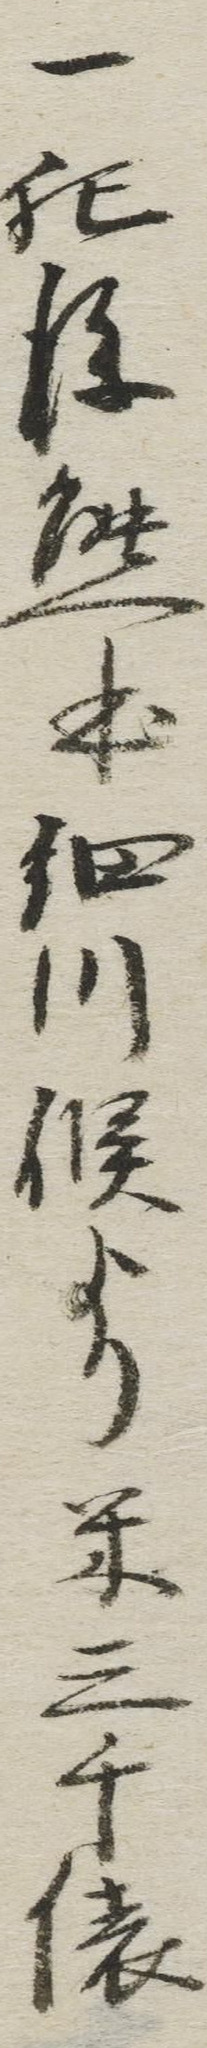一肥後熊本細川侯より米三千俵
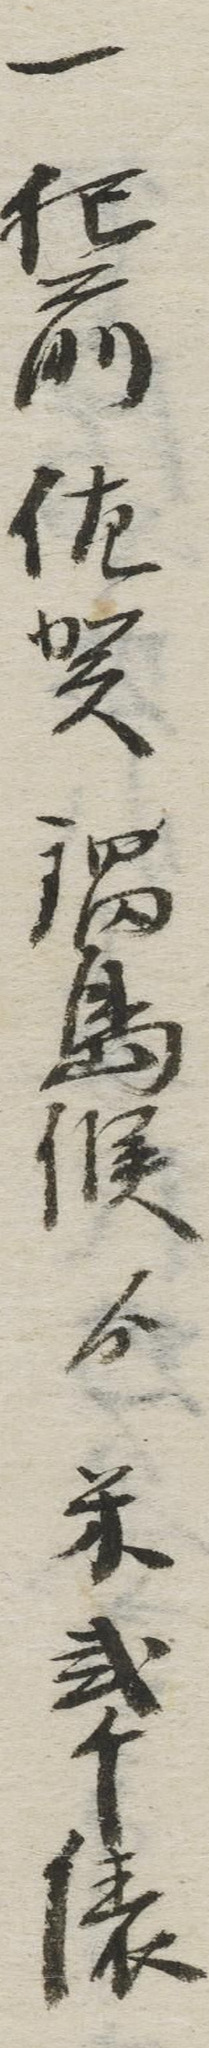一肥前佐賀鍋島侯ゟ米弐千俵
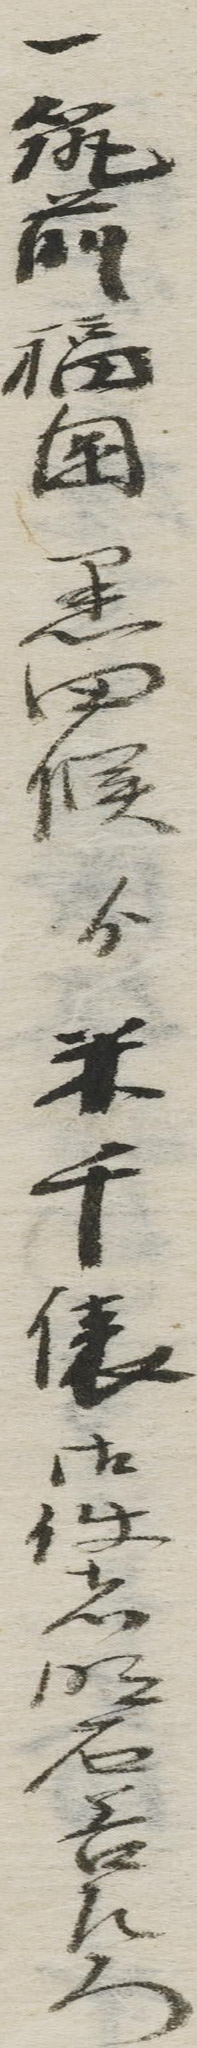一筑前福岡黒田侯ゟ米千俵御使者明石善左衛門
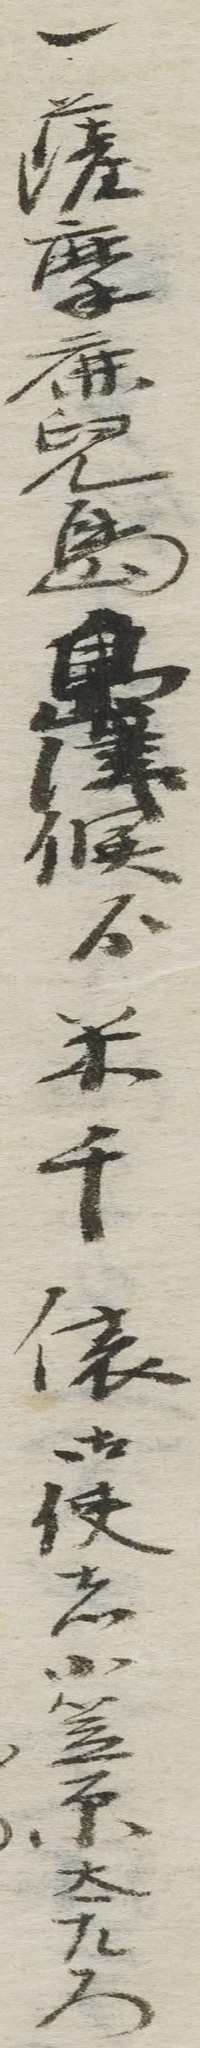一薩摩鹿児島島津侯ゟ米千俵御使者小笠原太左衛門
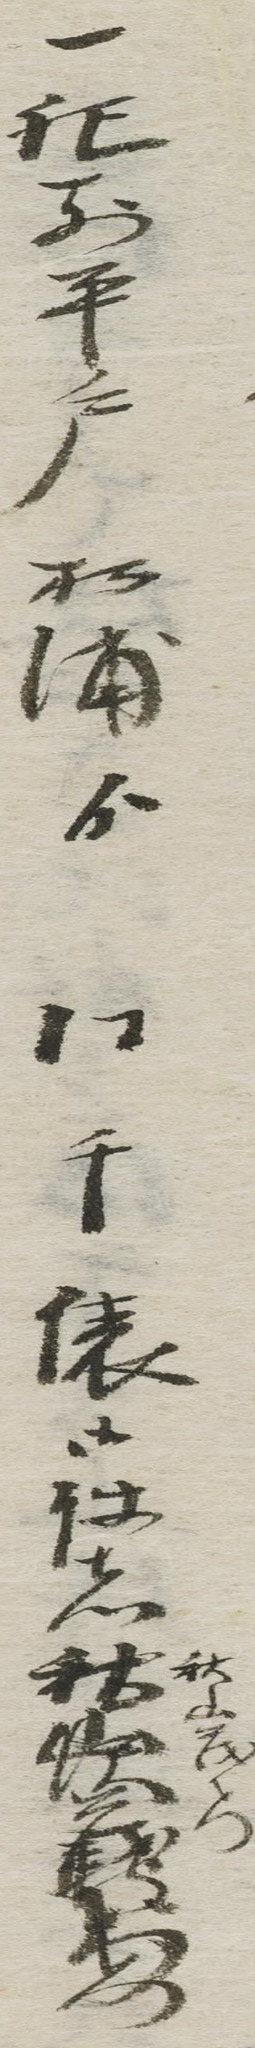一肥前平戸松浦ゟ同千俵御使者秋山茂右衛門
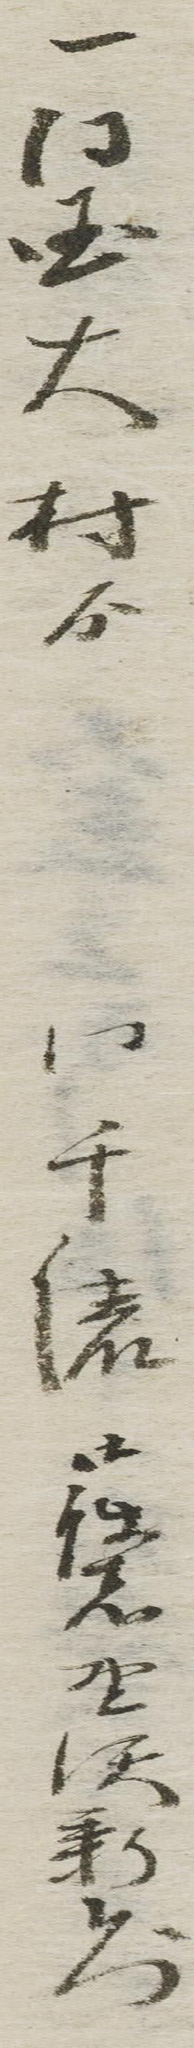一同国大村ゟ同千俵御使者野沢新右衛門
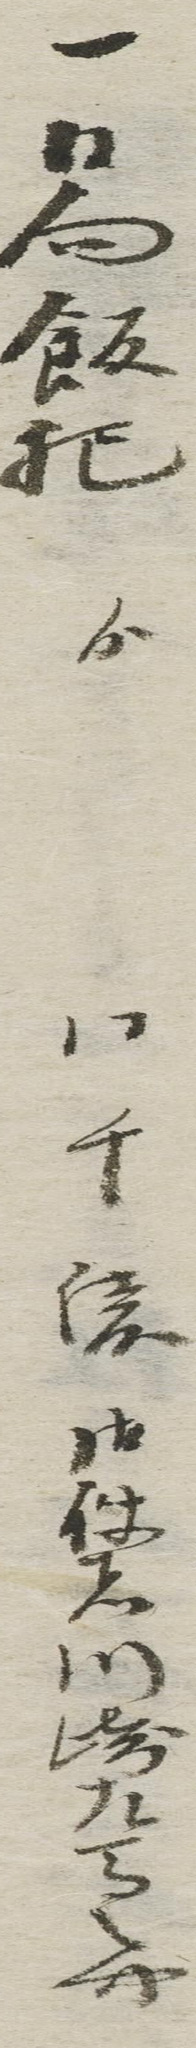一日向飯肥ゟ同千俵御使者川崎左馬之介
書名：肥前國島原領普賢山大変記　完
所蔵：東京大学地震研究所図書室 Earthquake Research Institute Library, The University of Tokyo, JAPAN
